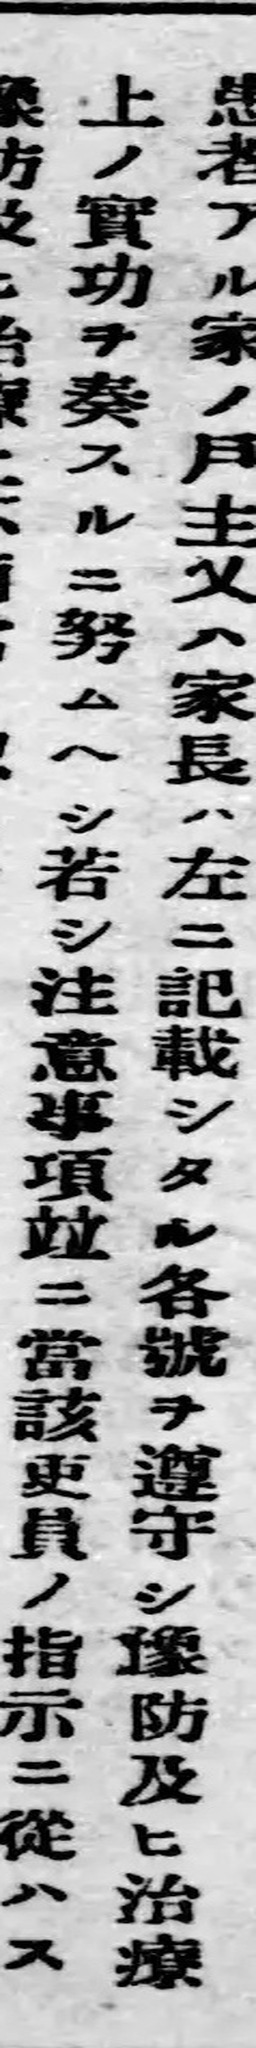│上ノ實行ヲ奏スルニ努ムヘシ若シ注意事項竝ニ當該吏員ノ指示ニ從ハス│
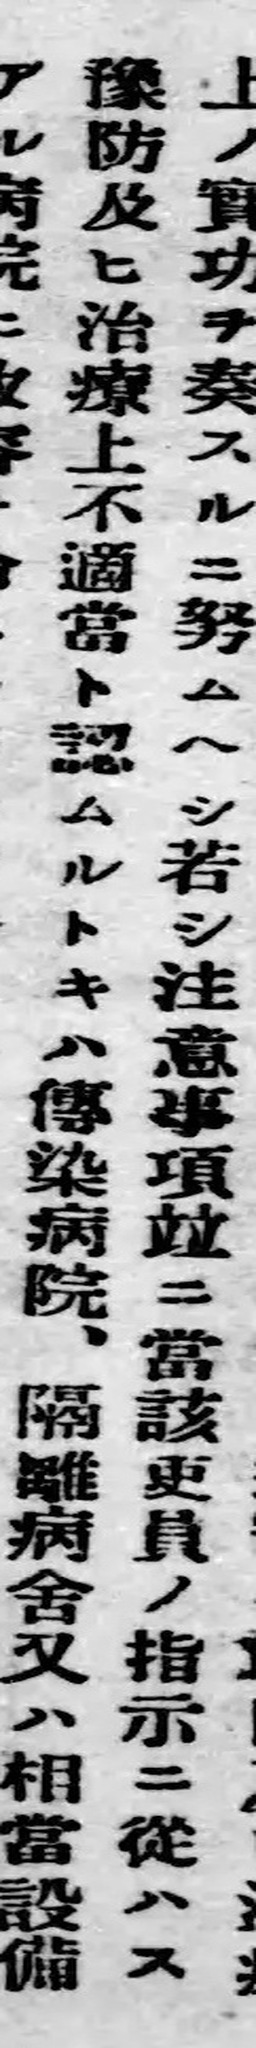│豫防及ヒ治療上不適當ト認ムルトキハ傅染病院、隔離病舎又ハ相當設備│

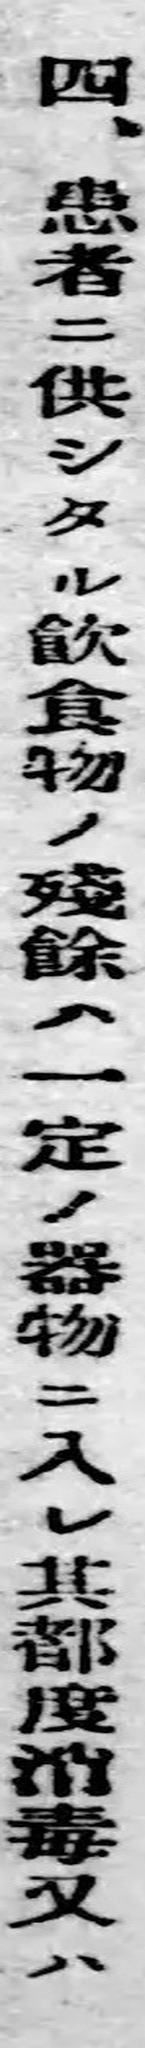│四、患者ニ供シタル飮食物ノ残餘ハ一定ノ器物ニ入レ其都度消毒又ハ│
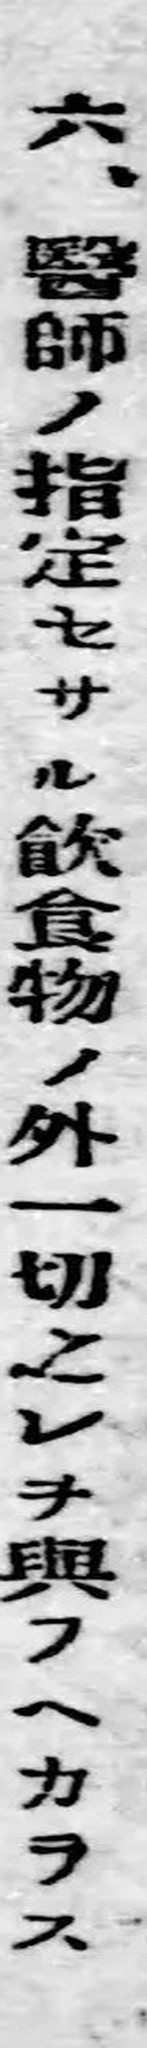│六、醫師ノ指定セサル飮食物ノ外一切之レヲ興フヘカラス│
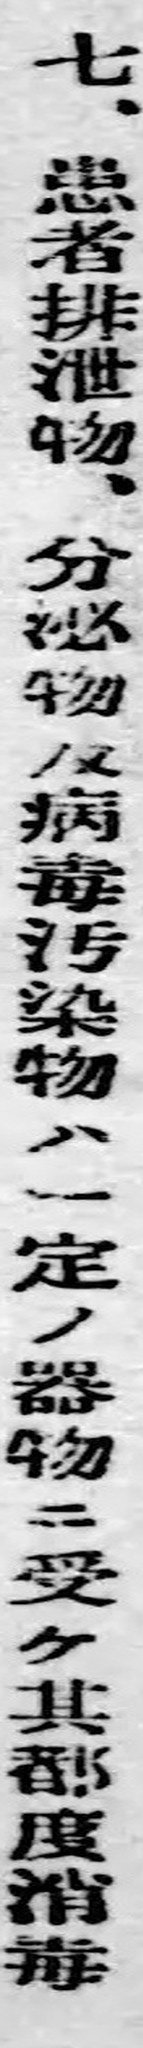│七、患者排泄物、分泌物及病毒汚染物ハ一定ノ器物ニ受ケ其都度消毒│
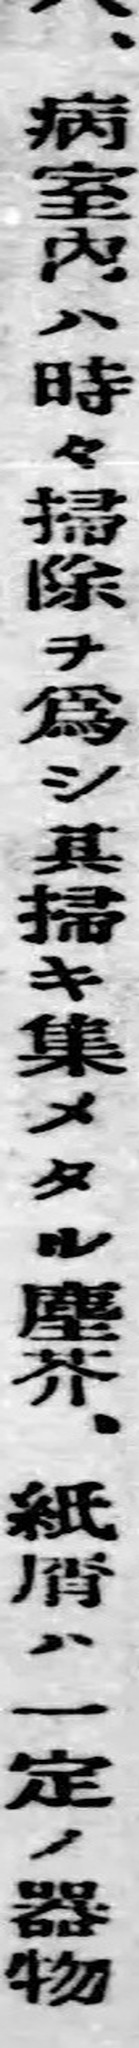│八、病室内ハ時々掃除ヲ爲シ其掃キ集メタル塵芥、紙屑ハ一定ノ器物│
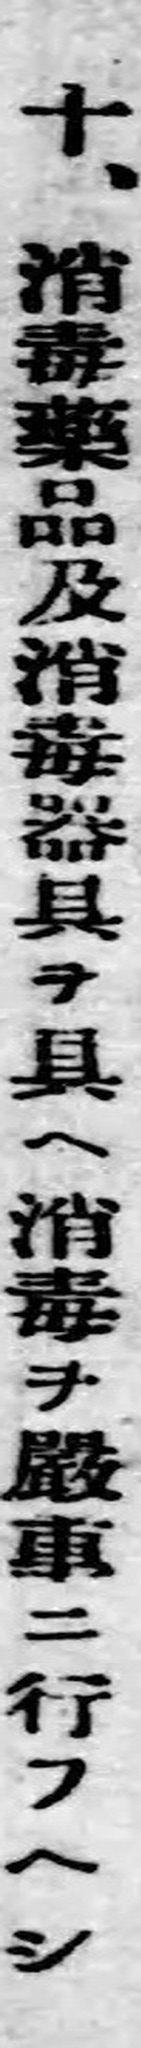│十、消毒藥品及消毒器具ヲ具ヘ消毒ヲ嚴重ニ行フヘシ│
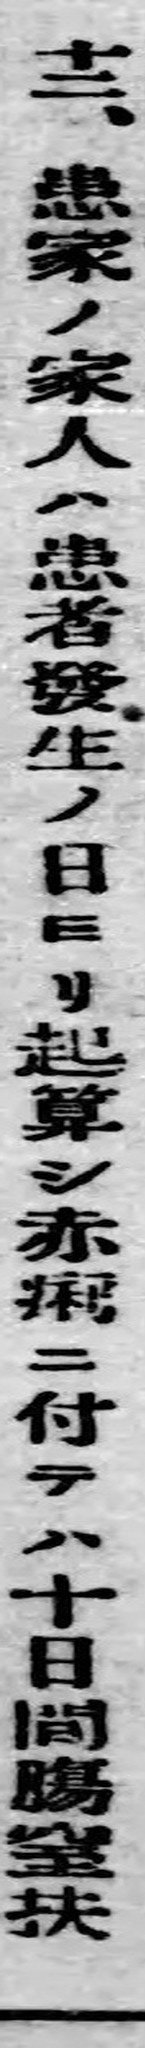│十二、患家ノ家人ハ患者發生ノ日ヨリ起算シ赤痢ニ付テハ十日間膓窒扶│
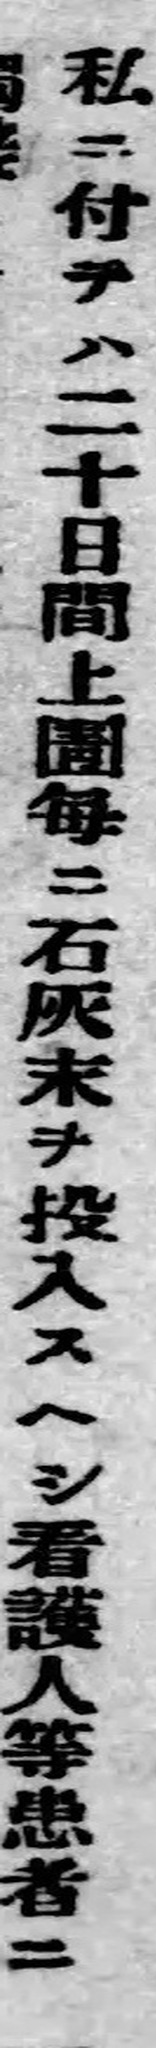│私ニ付テハ二十日間上圊毎ニ石灰末ヲ投入スヘシ看護人等患者ニ│
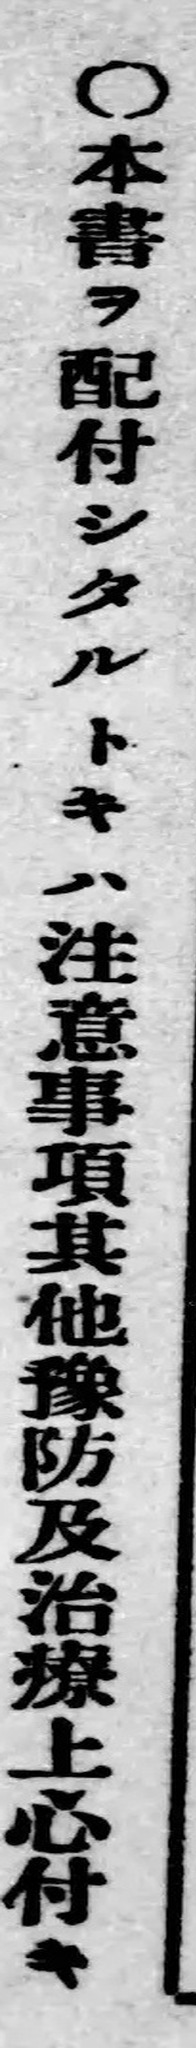○本書ヲ配付シタルトキハ注意事項其他豫防及治療上心付キ

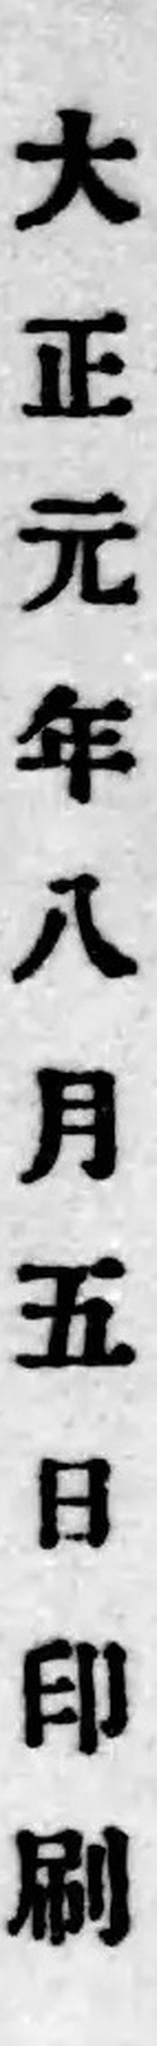大正元年八月五日印刷
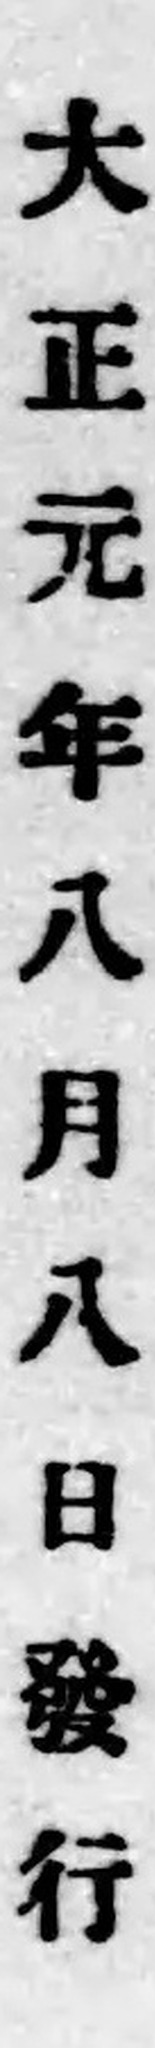大正元年八月八日發行
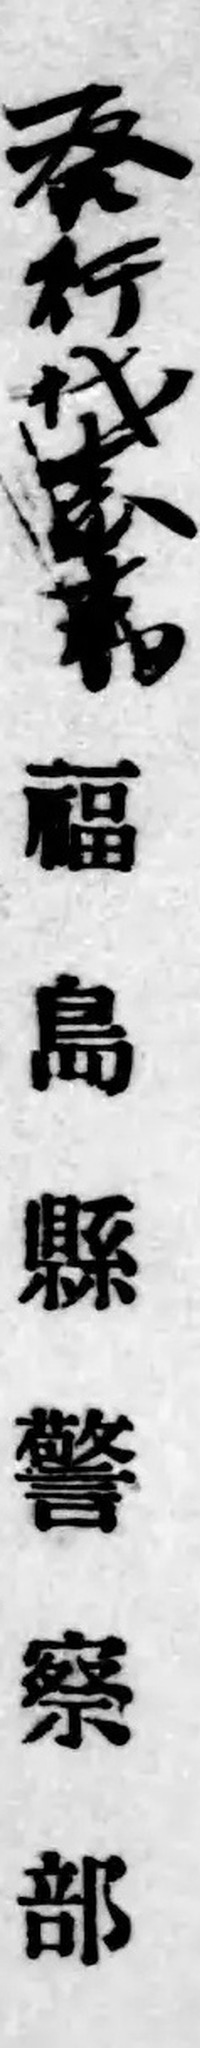発行代表人福島縣警察部
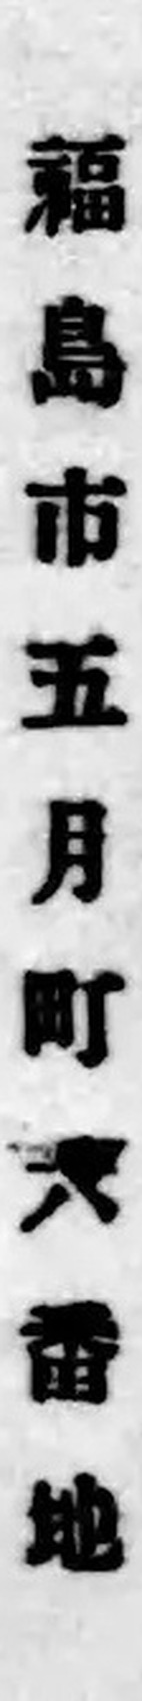福島市五月町六番地
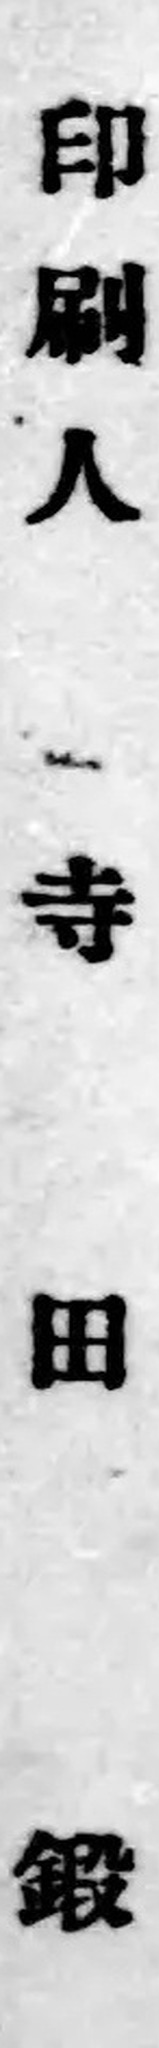印刷人寺田鍛
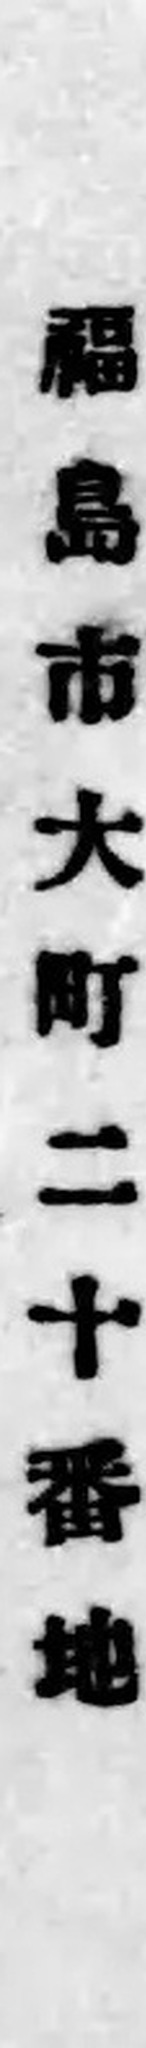福島市大町二十番地
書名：袖珍防疫必携
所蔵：国立国会図書館 National Diet Library, JAPAN
